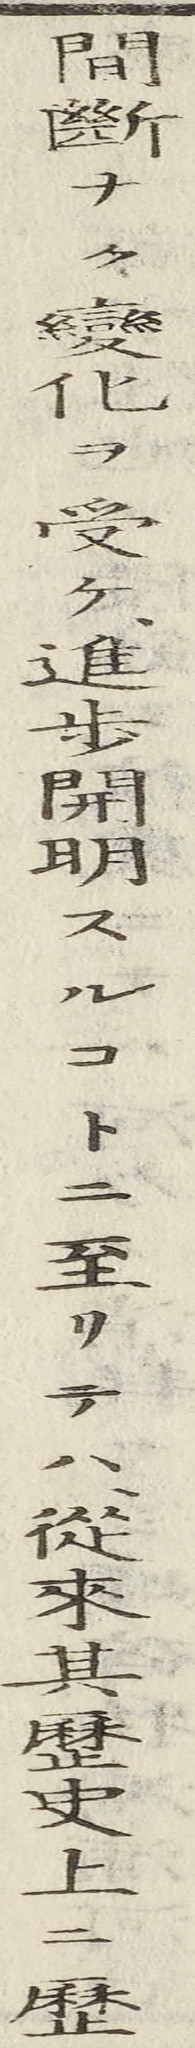間断ナク変化ヲ受ケ、進歩開明スルコトニ至リテハ、従来其歴史上ニ歴
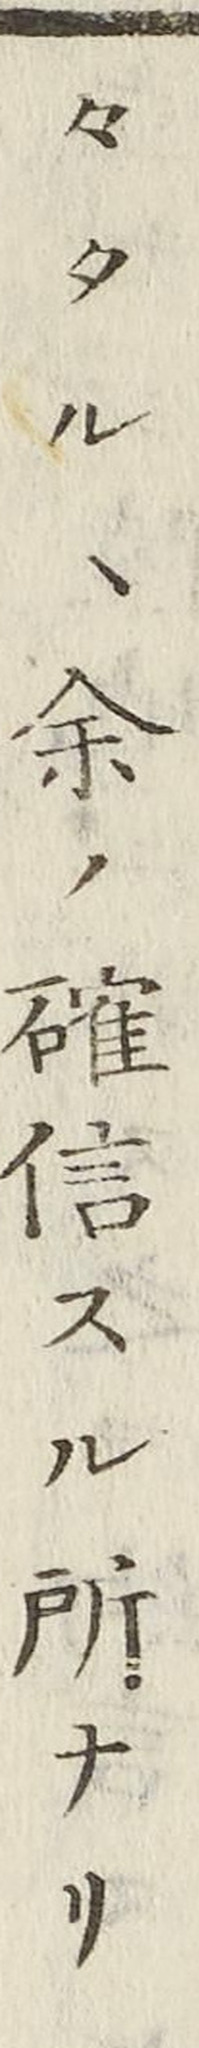々タルヽ余ノ確信スル所ナリ
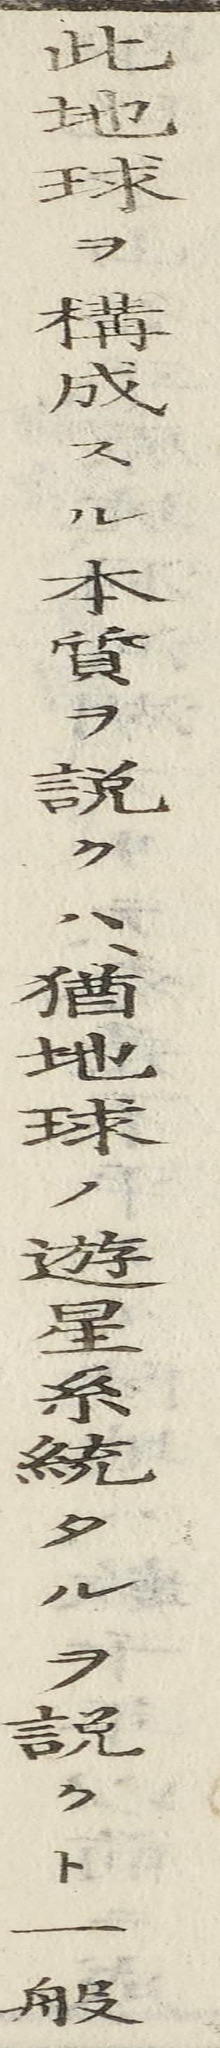此地球ヲ構成スル本質ヲ説クハ、猶地球ノ遊星系統タルヲ説クト一般
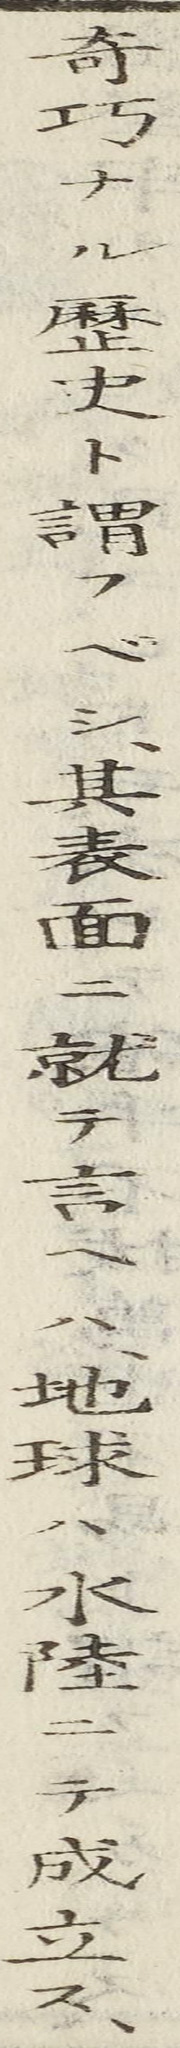奇巧ナル歴史ト謂フベシ、其表面ニ就テ言ヘハ、地球ハ水陸ニテ成立ス、、
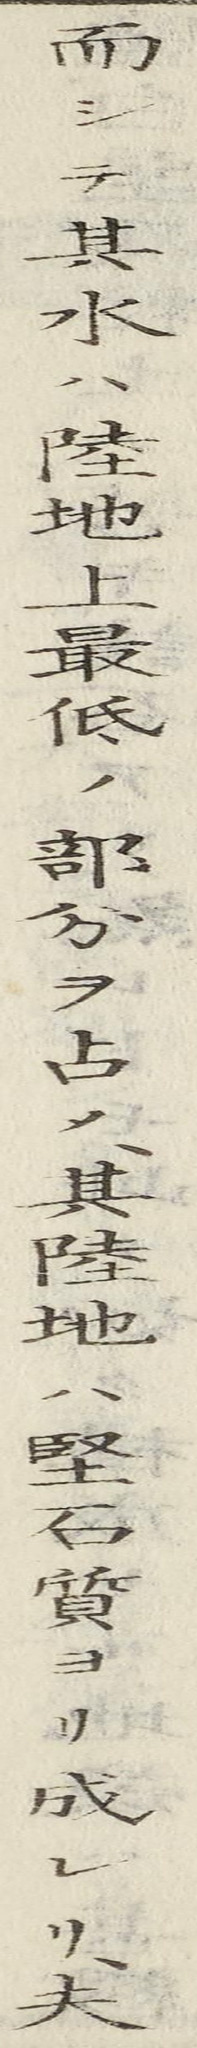而シテ其水ハ陸地上最低ノ部分ヲ占メ、其陸地ハ堅石質ヨリ成レリ、夫
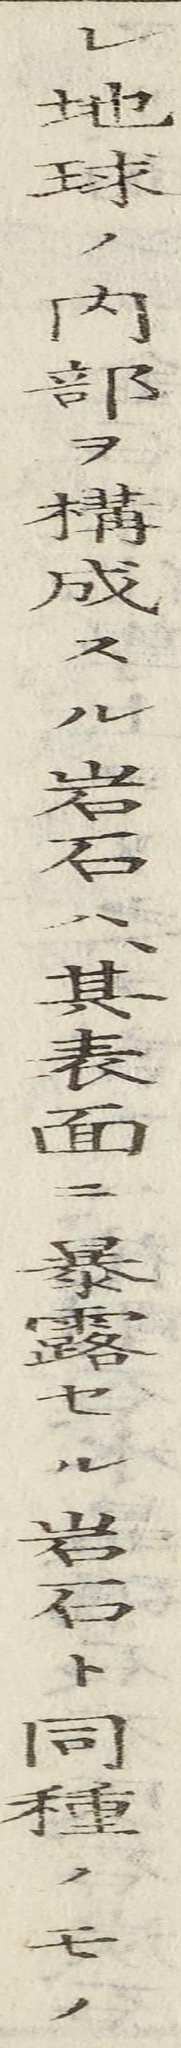レ地球ノ内部ヲ構成スル岩石ハ、其表面ニ暴露セル岩石ト同種ノモノ
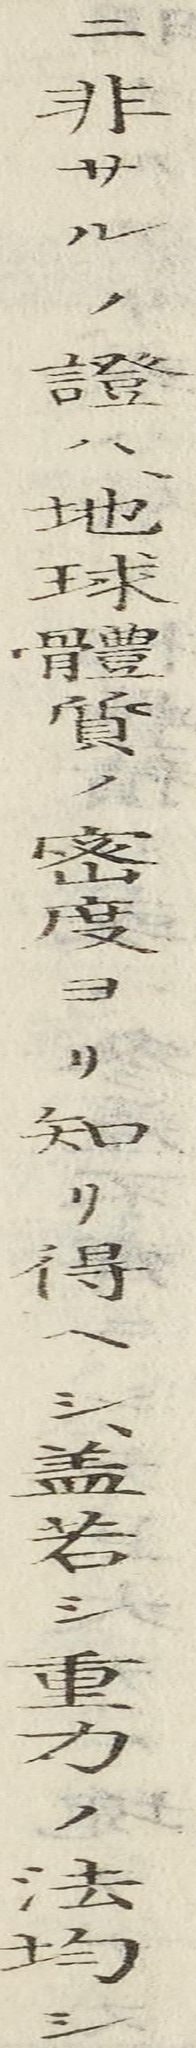ニ非サルノ証ハ、地球体質ノ密度ヨリ知リ得ヘシ、盖若シ重力ノ法均シ
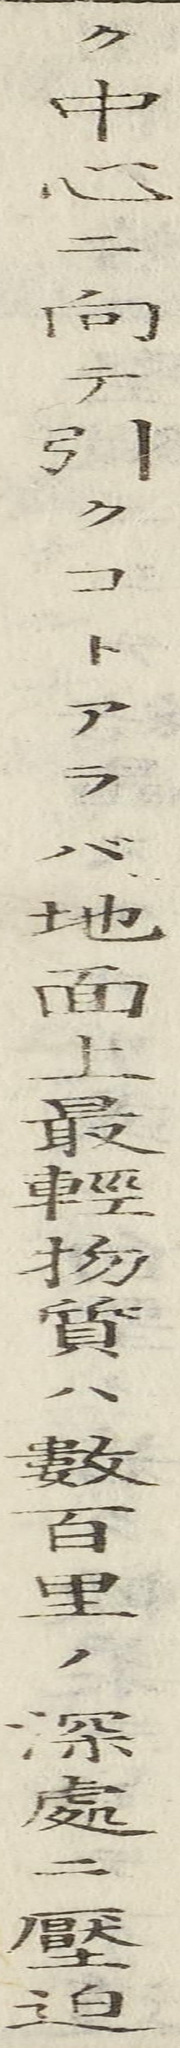ク中心ニ向テ引クコトアラバ地面上最軽物質ハ数百里ノ深処ニ圧迫
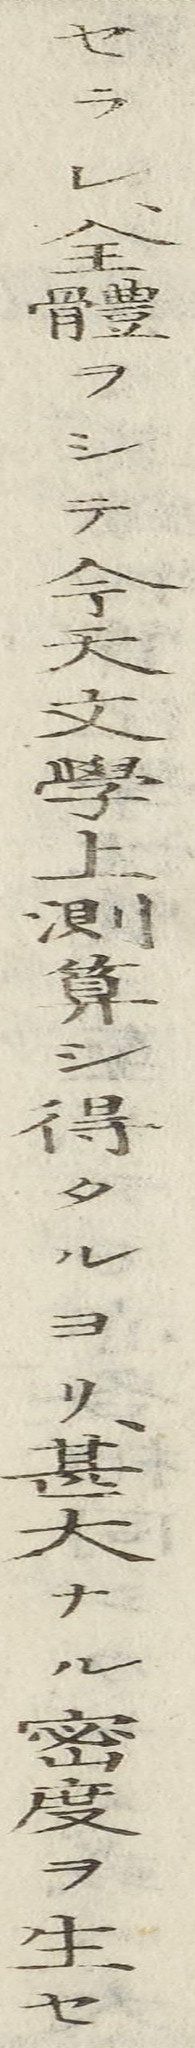セラレ、全体ヲシテ今天文学上測算シ得タルヨリ、甚大ナル密度ヲ生セ
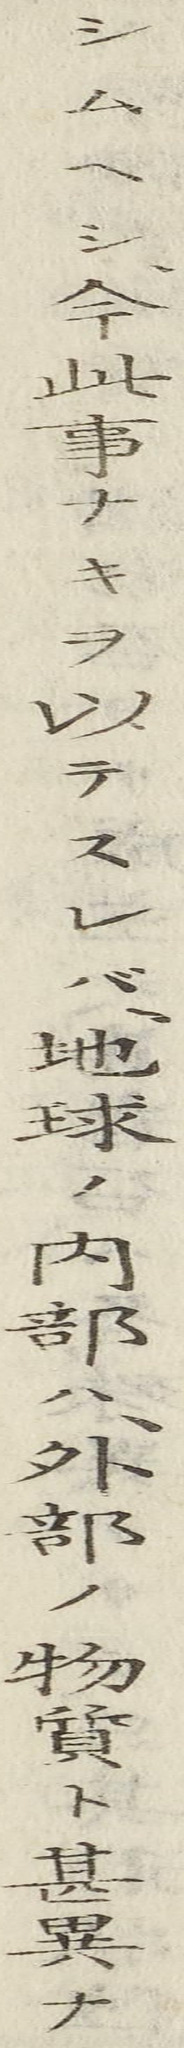シムヘシ、今此事ナキヲ以テスレバ、地球ノ内部ハ、外部ノ物質ト甚異ナ
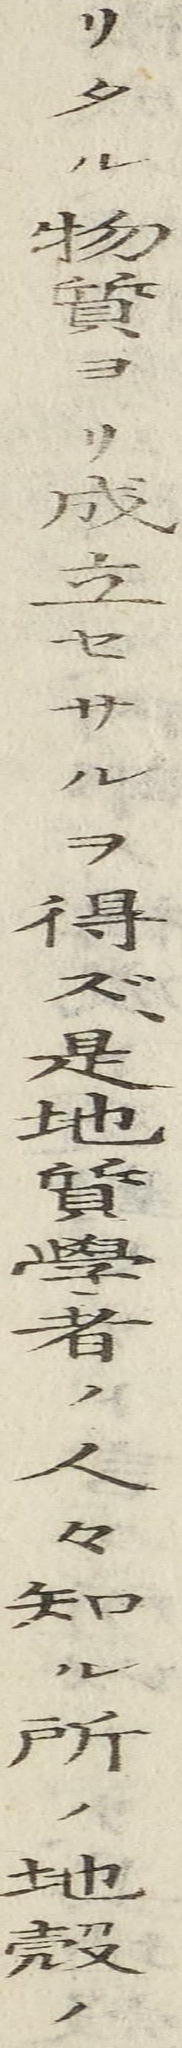リタル物質ヨリ成立セサルヲ得ズ、是地質学者ノ人々知ル所ノ地殻ノ

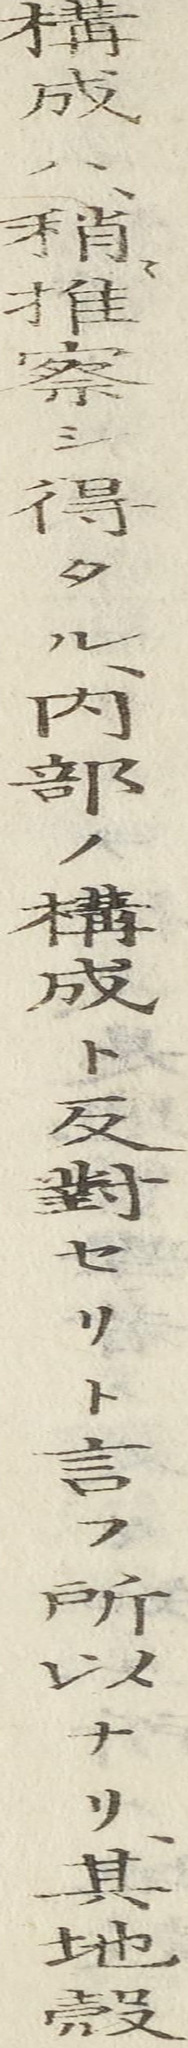構成ハ、稍〻推察シ得タル、内部ノ構成ト反対セリト言フ所以ナリ、其地殻
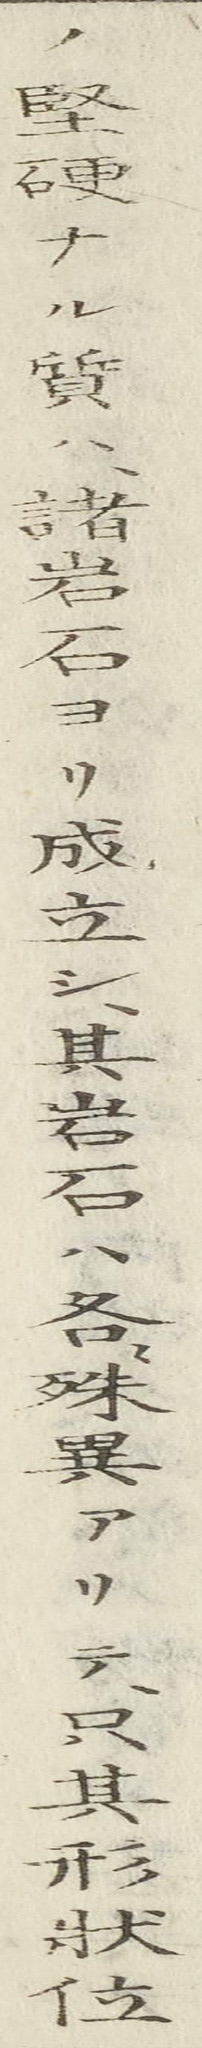ノ堅硬ナル質ハ、諸岩石ヨリ成立シ、其岩石ハ各〻殊異アリテ、只其形状位
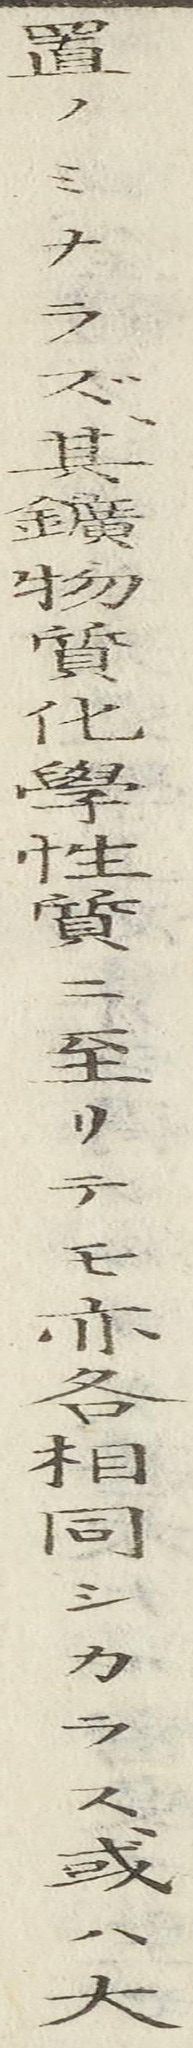置ノミナラズ、其鉱物質化学性質ニ至リテモ亦各相同シカラス、或ハ大
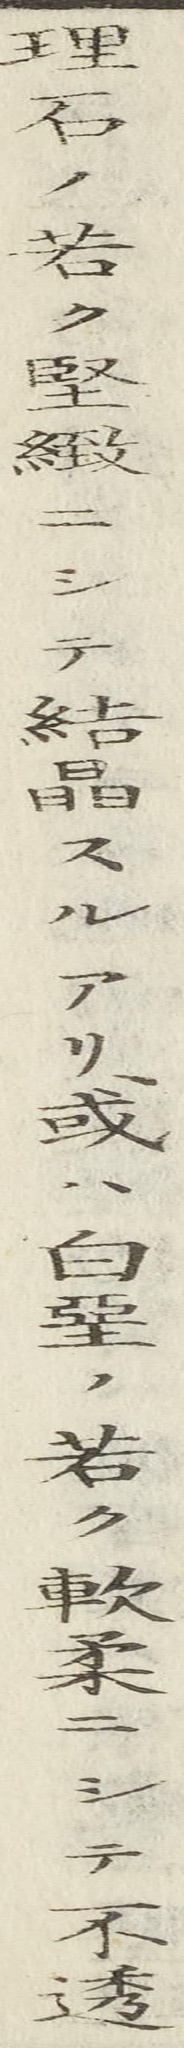理石ノ若ク堅緻ニシテ結晶スルアリ、或ハ白垔ノ若ク軟柔ニシテ不透
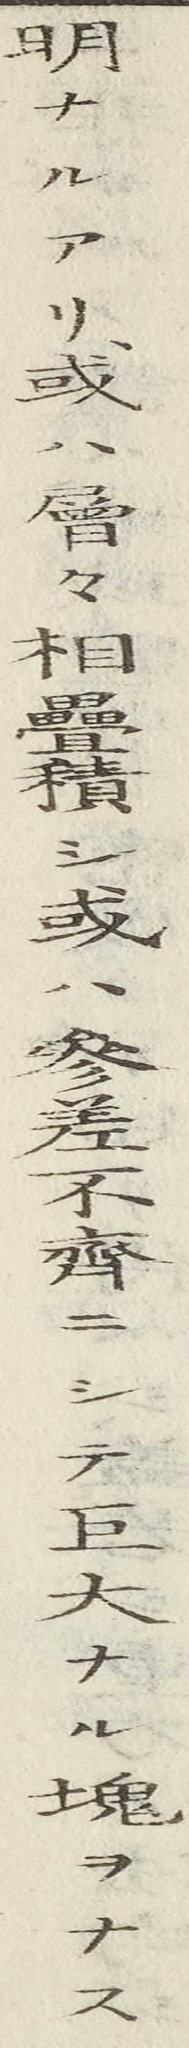明ナルアリ、或ハ層々相畳積シ或ハ参差不斉ニシテ巨大ナル塊ヲナス
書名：百科全書　地文學　全
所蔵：東京大学地震研究所図書室 Earthquake Research Institute Library, The University of Tokyo, JAPAN
